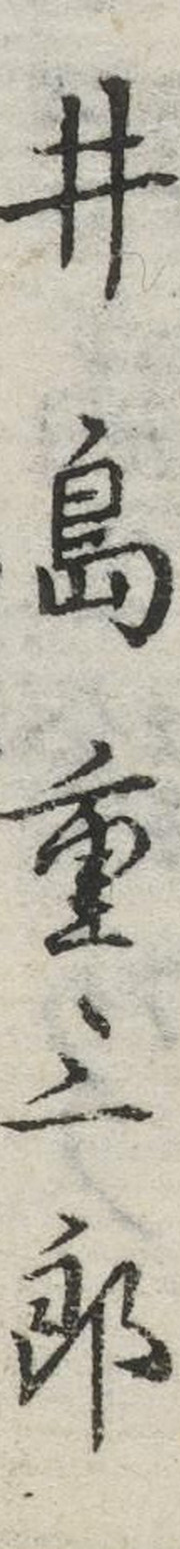井島重三郎
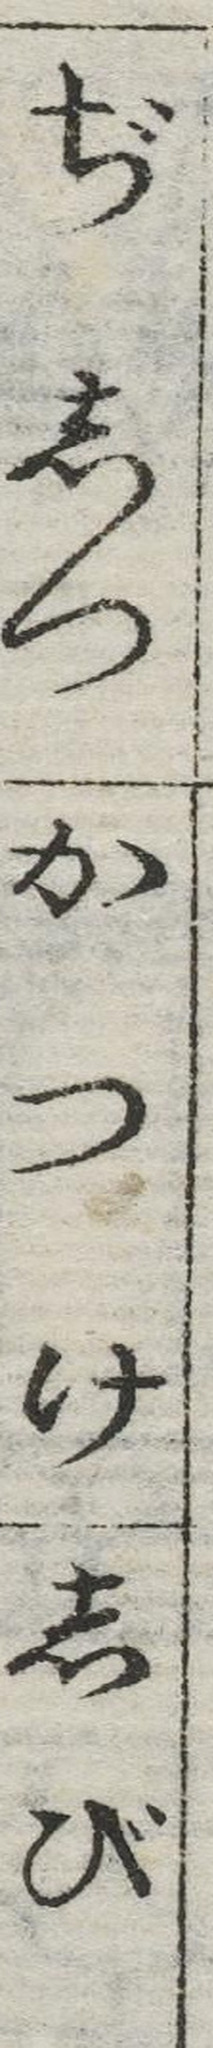ぢしつかつけしびれ
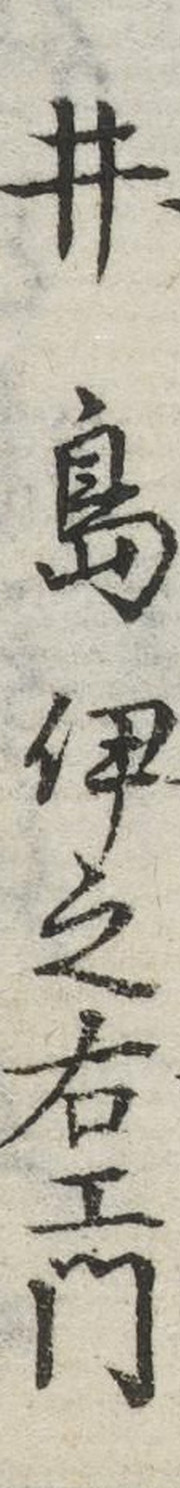井島伊之右衛門
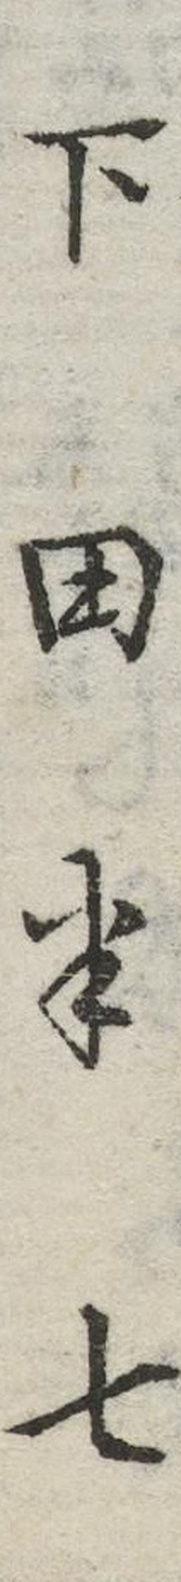下田半七
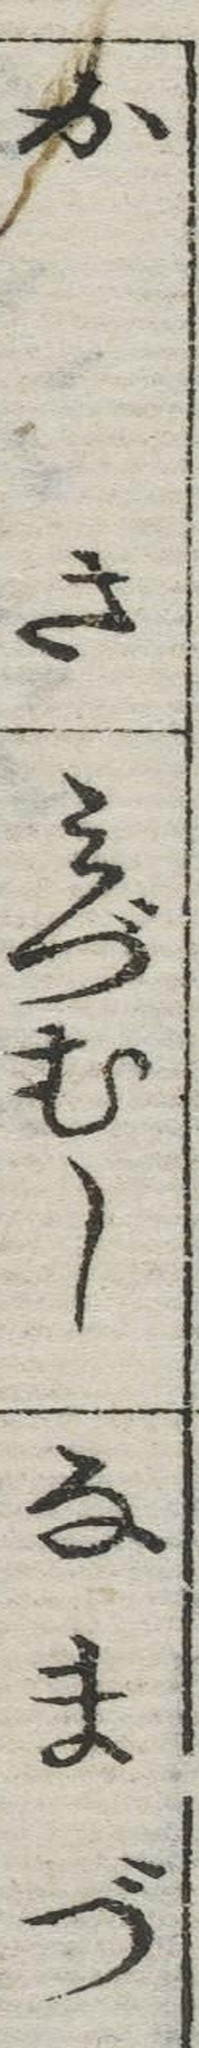かさみづむしなまづ
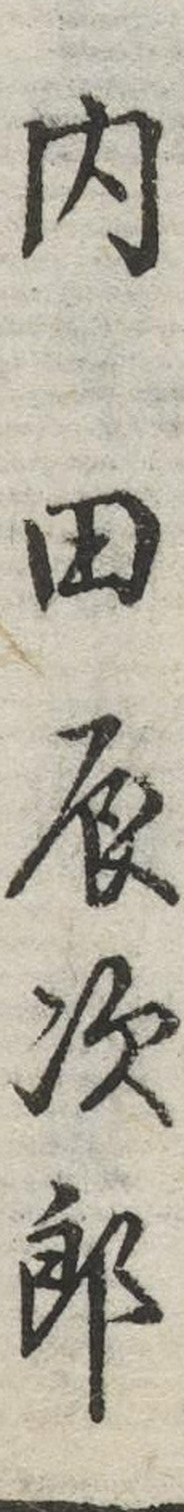内田辰次郎
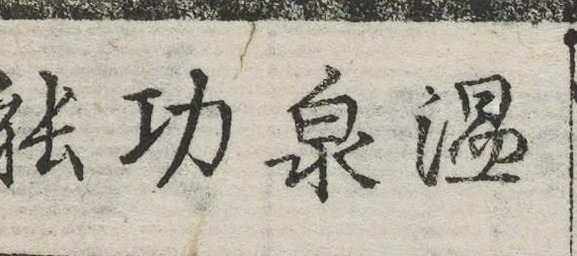温泉宿
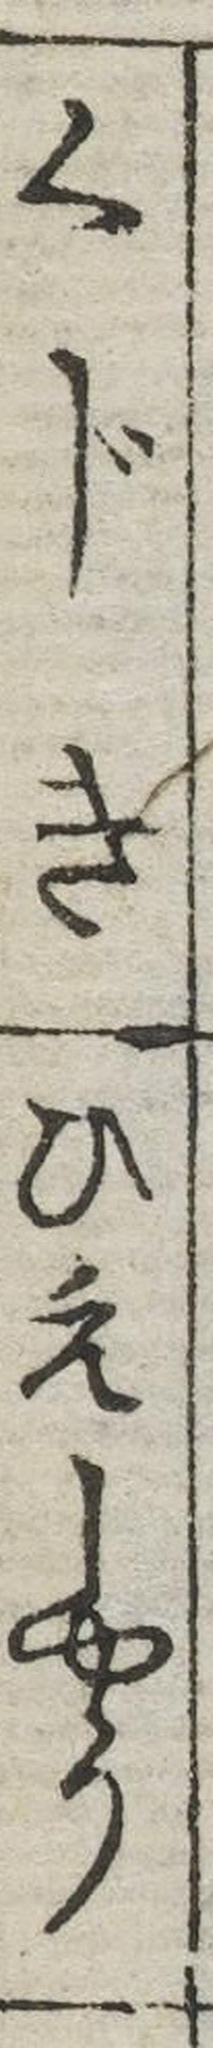くじきひえしやう

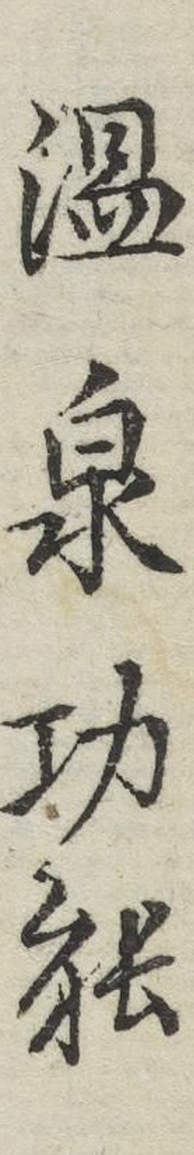温泉功能
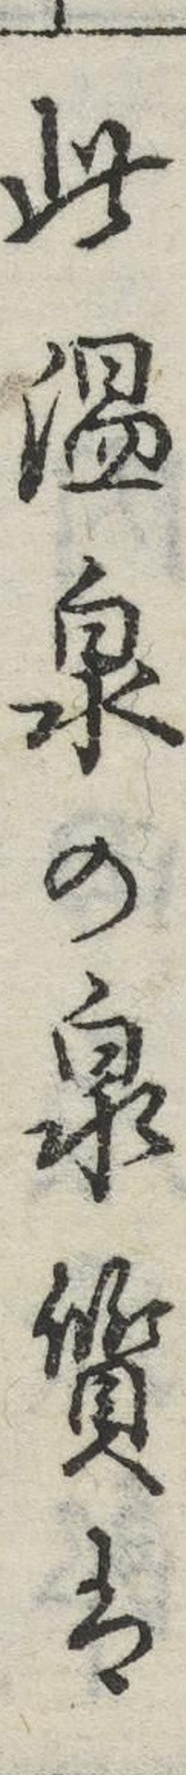此温泉の泉質は
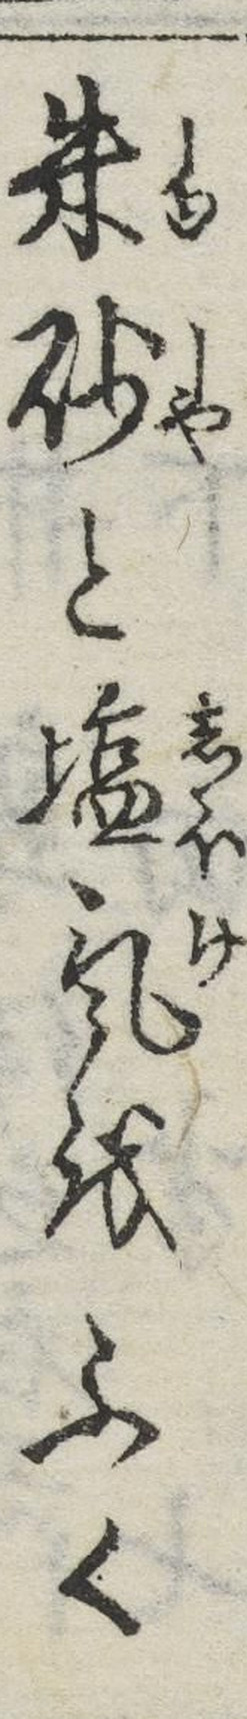朱砂と塩気をふく
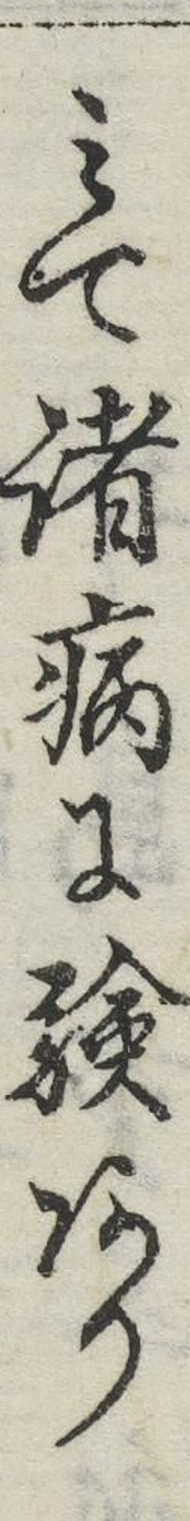みて諸病に験あり
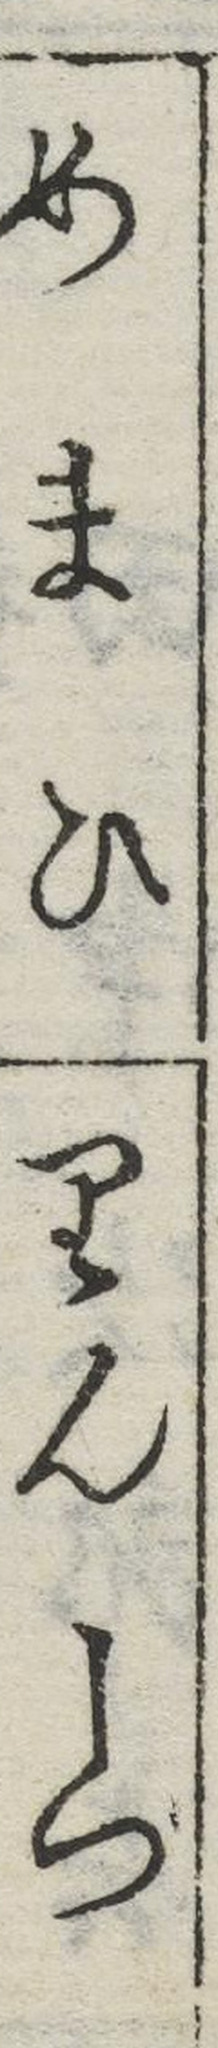めまひりんしつ
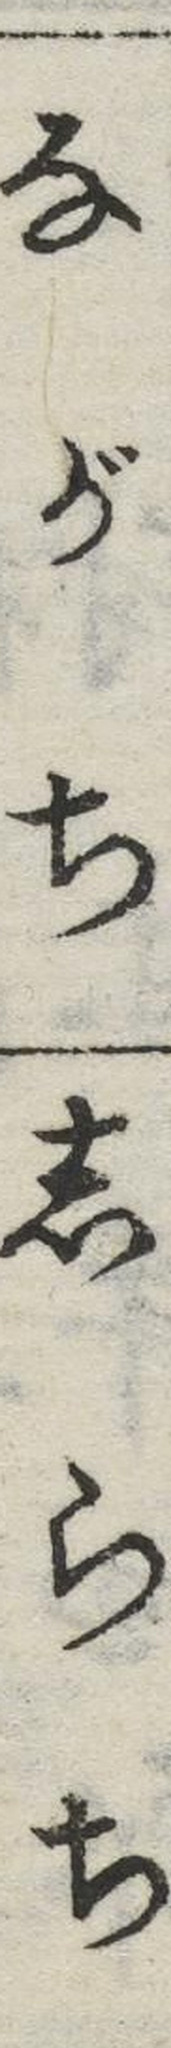ながちしらち
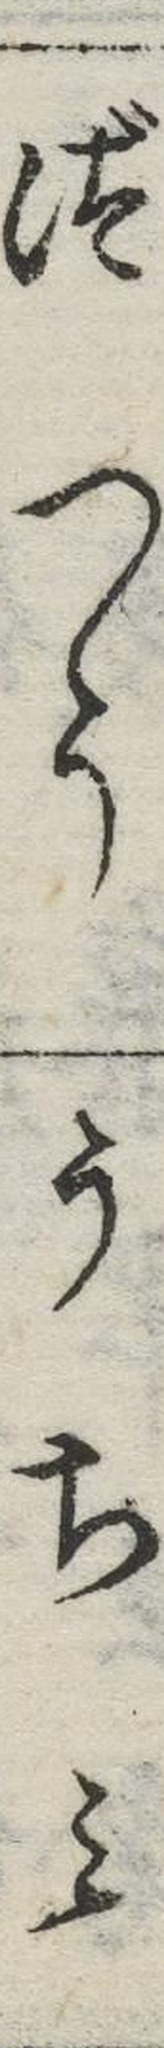づつううちみ
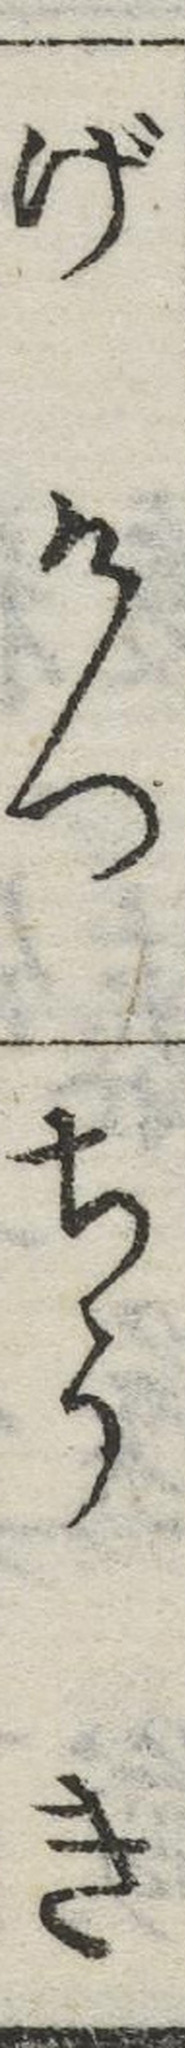げけつちうき
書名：諸國温泉遊覽記　全
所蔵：東京大学地震研究所図書室 Earthquake Research Institute Library, The University of Tokyo, JAPAN
